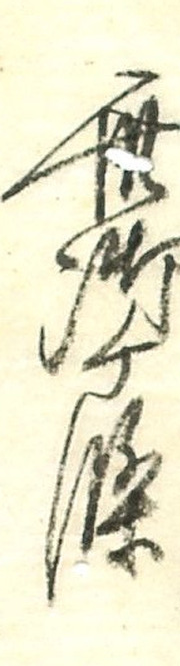此御ヶ條
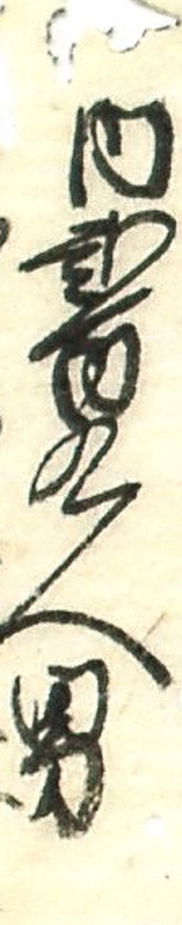内弐百九人男
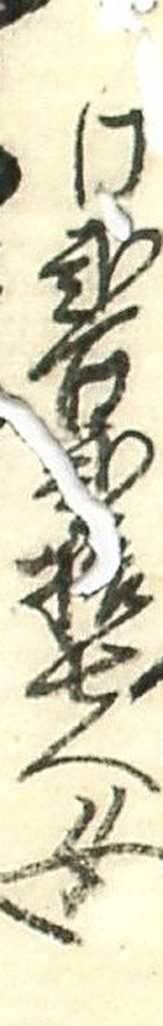同弐百拾七人女
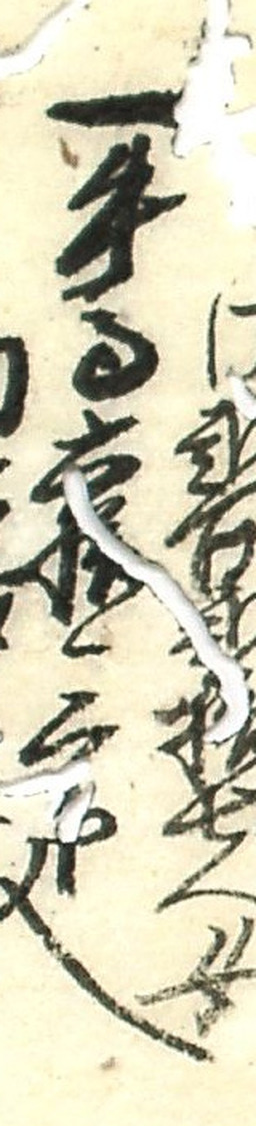一牛馬六拾三疋
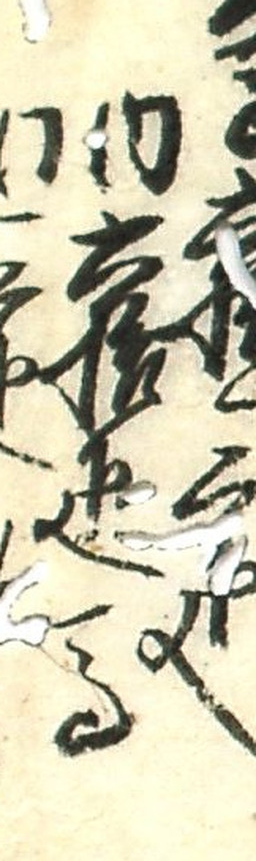内六拾疋馬
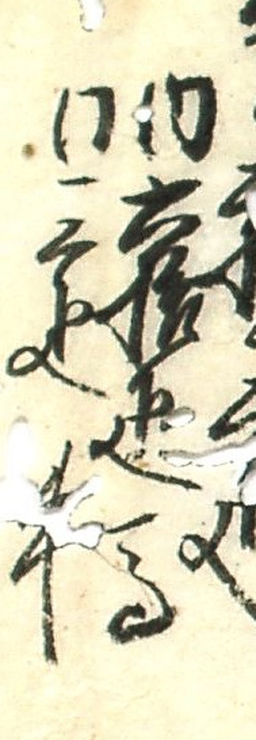内六拾疋馬

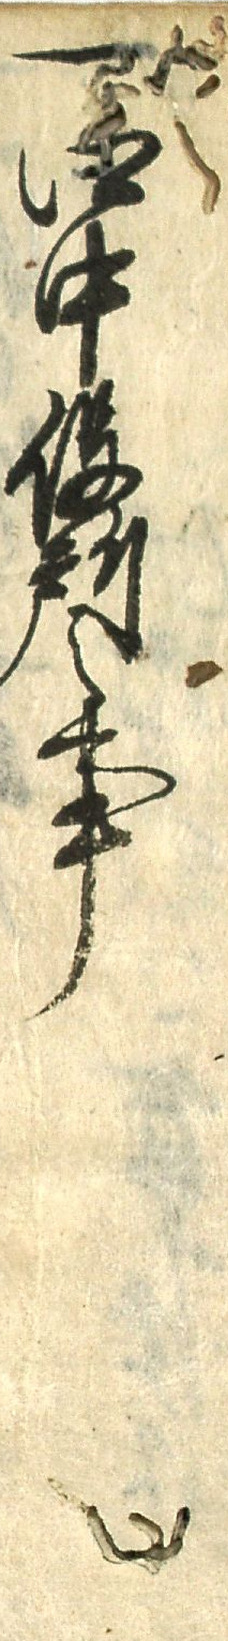一郷中役所之事
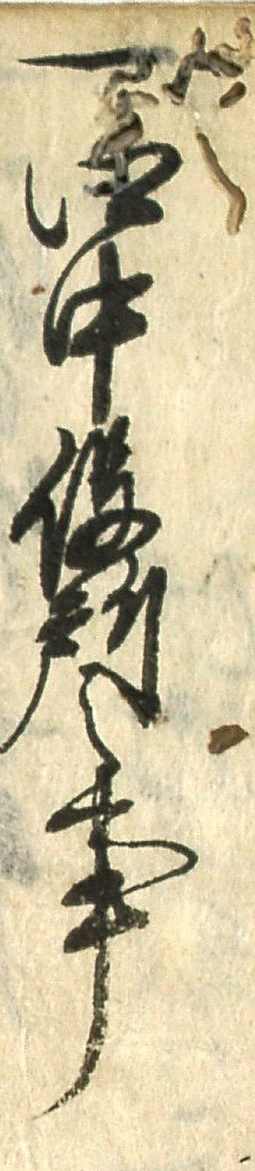一郷中役所之事
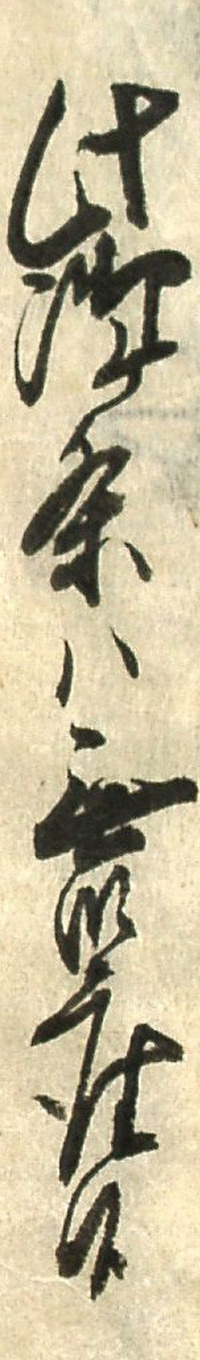此御ヶ条ハ無御座候
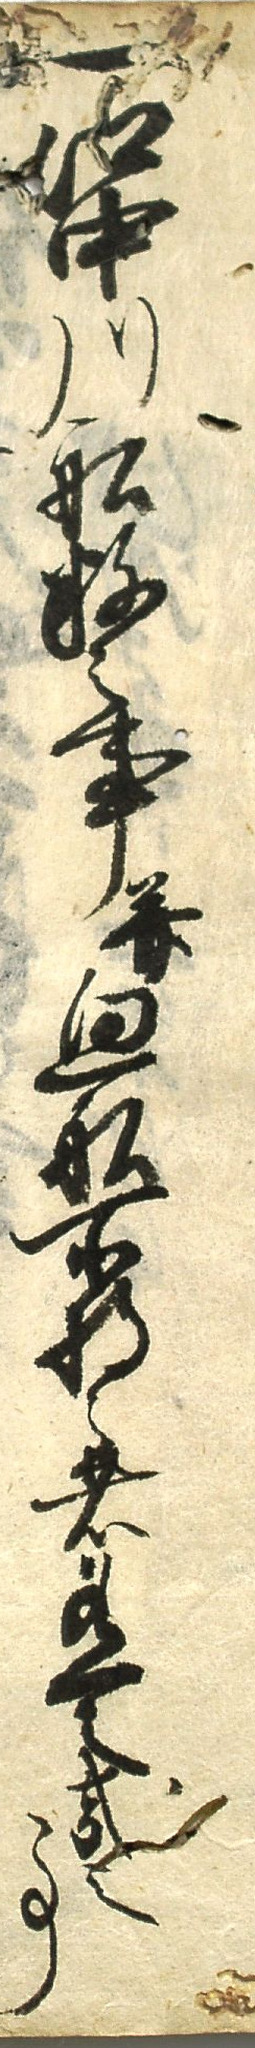一郷中川舩数之事幷廻舩所持之者有之哉之事
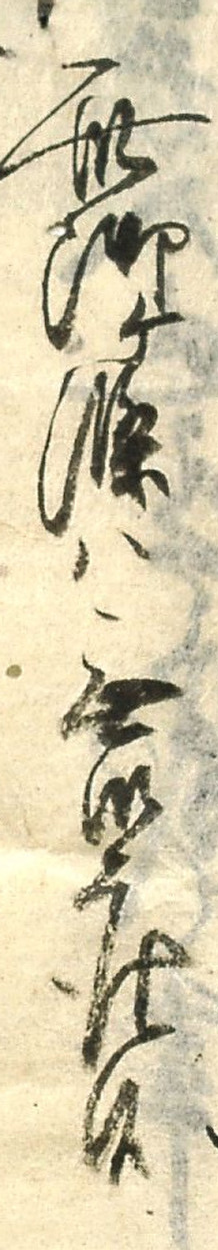此御ヶ條ハ無御座候
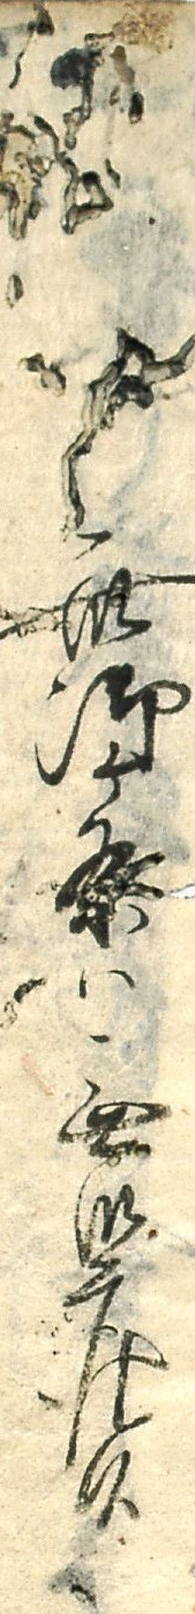此御ヶ条ハ無御座候
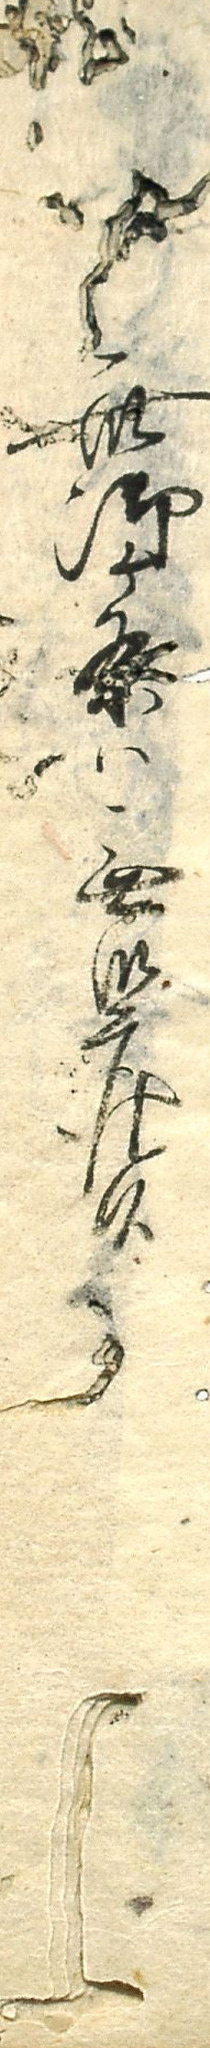此御ヶ条ハ無御座候
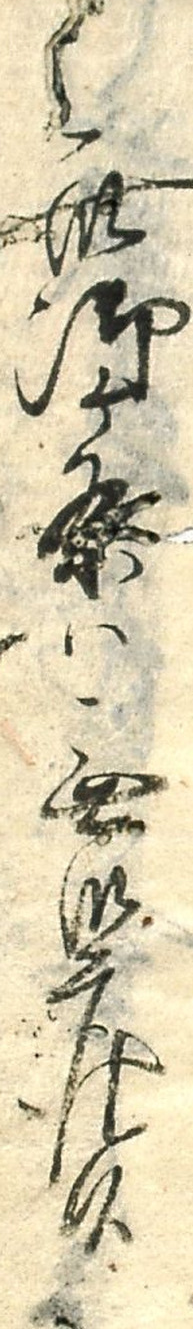此御ヶ条ハ無御座候
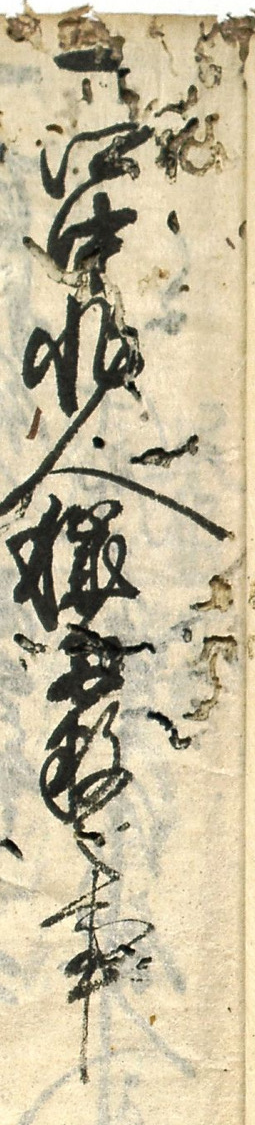一郷中非人穢多数之事
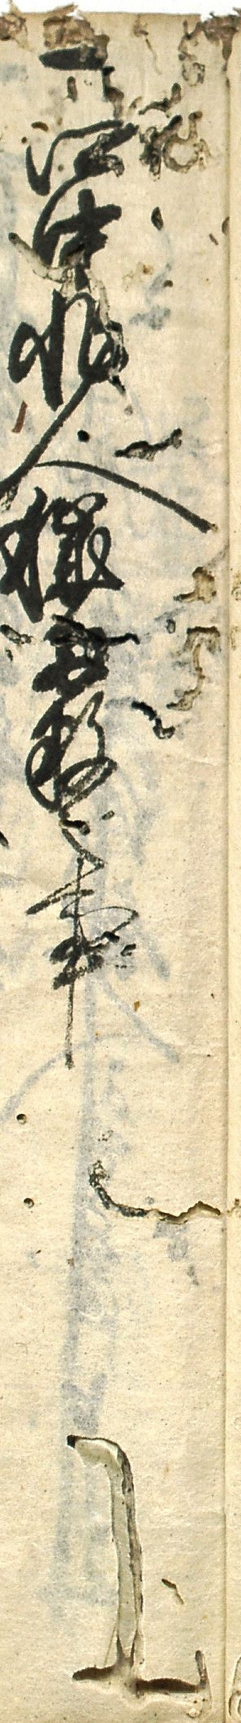一郷中非人穢多数之事
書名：御ヶ条ヲ以被仰附株々申上帳（早渕村控）
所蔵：鳴門教育大学 Naruto University of Education
